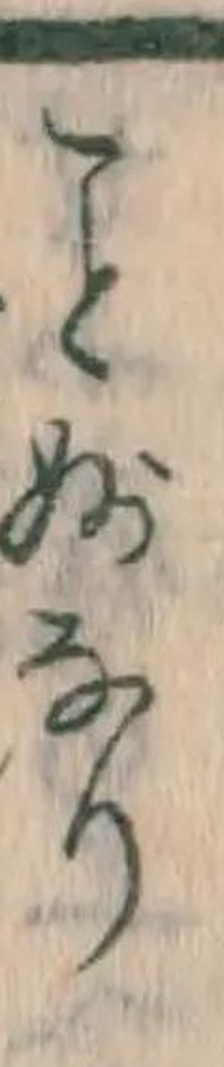こと妙なり
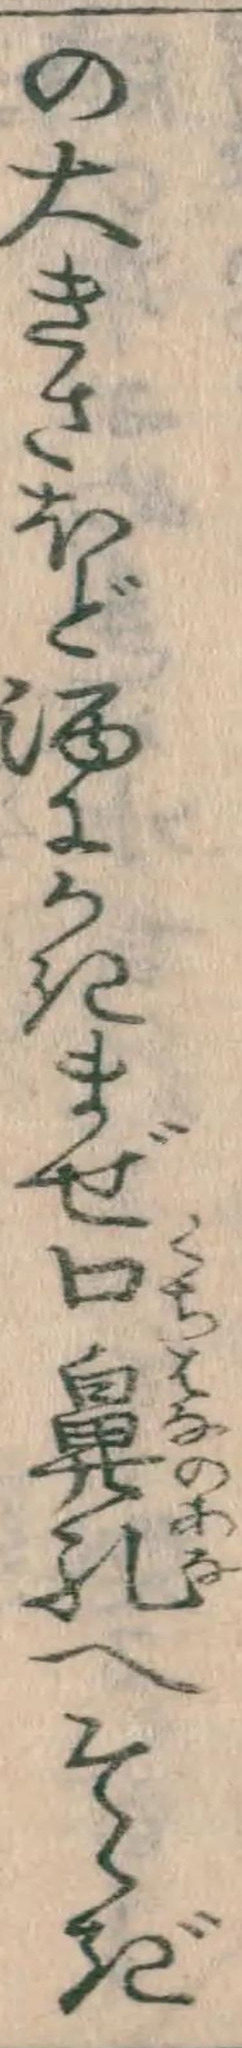の大きさほど酒にかきまぜ口鼻孔へそゝぎ
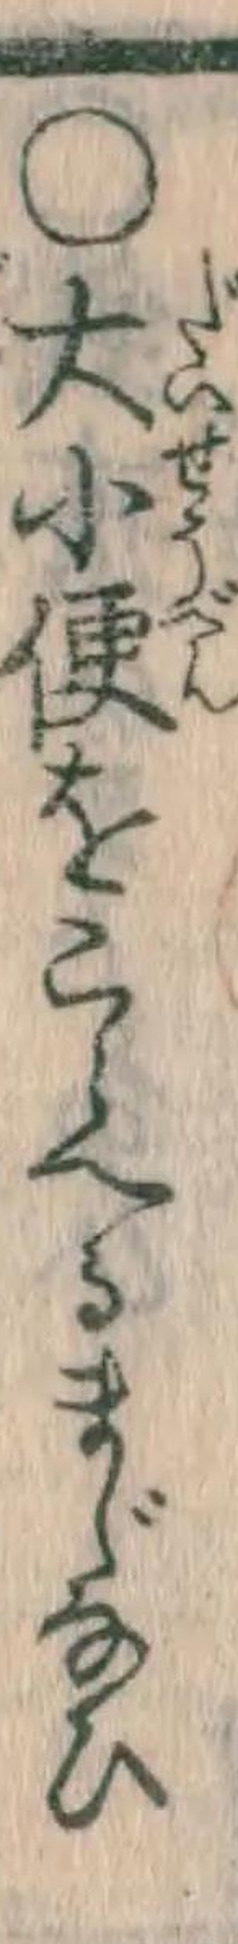○大小便をこらへるまじなひ
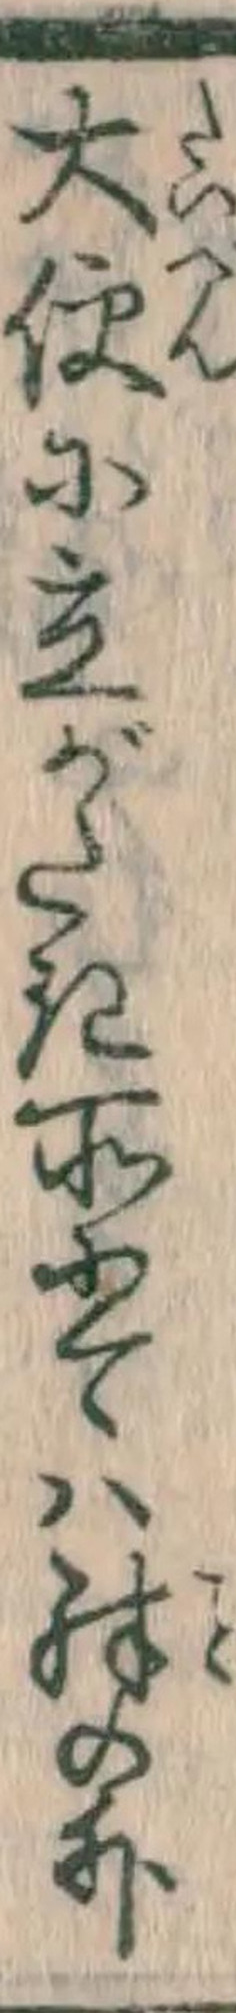大便に立がたき所にては殊の外
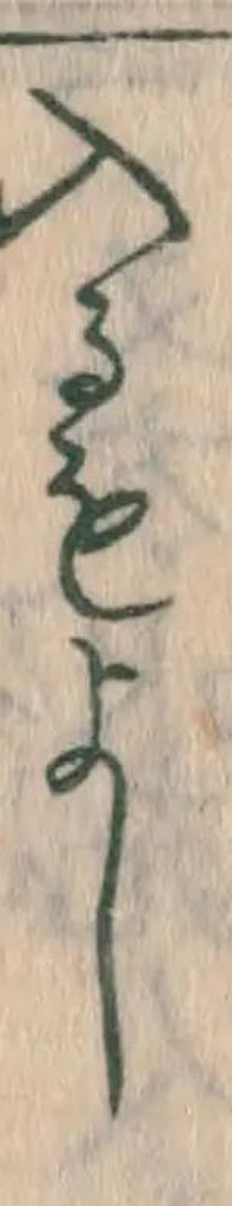入るもよし
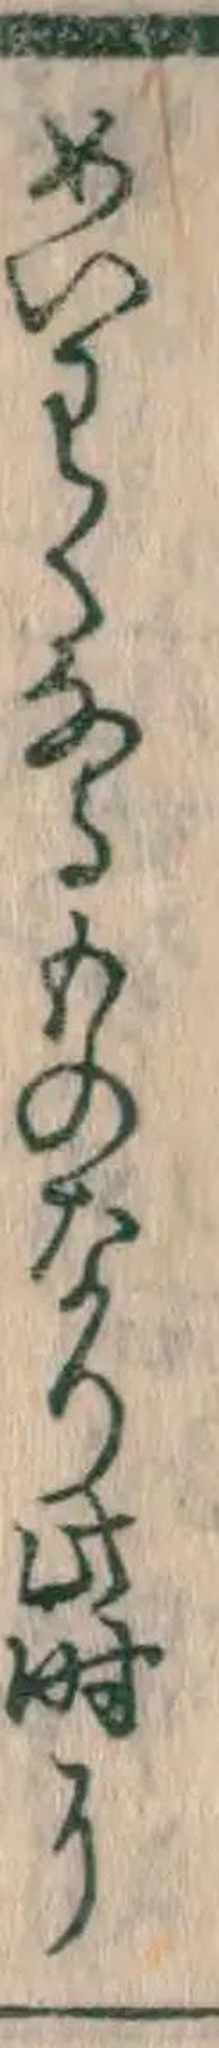めいわくなるものなり此時に
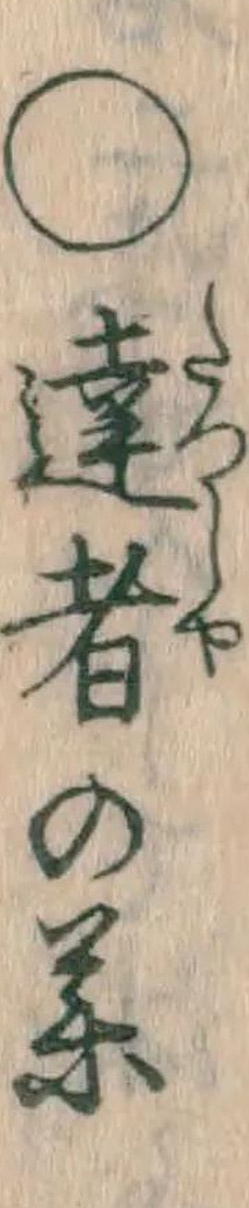○達者の薬
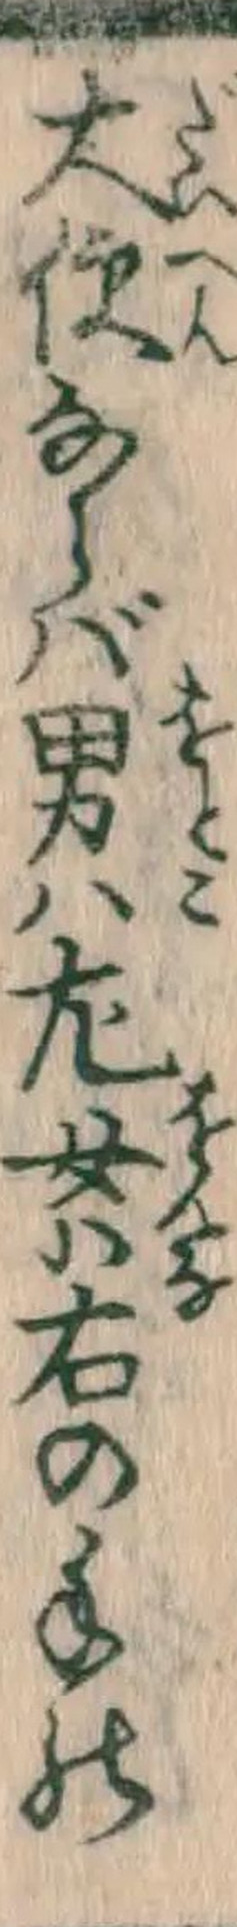大便ならば男は左女は右の手の
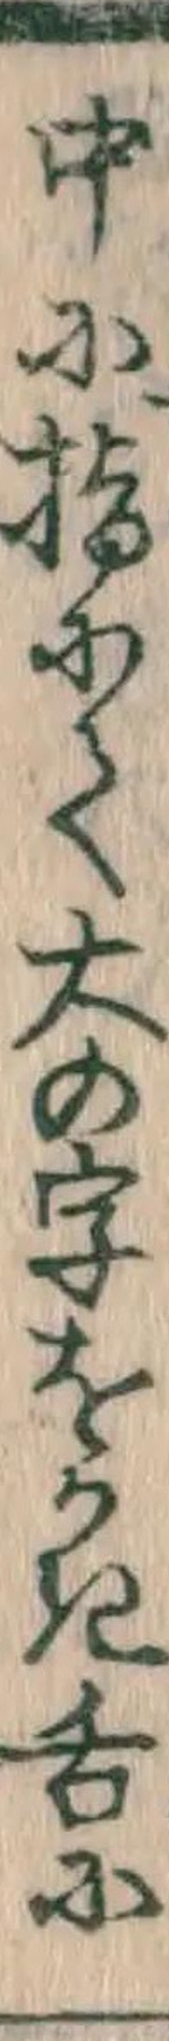中に指にて大の字をかき舌に
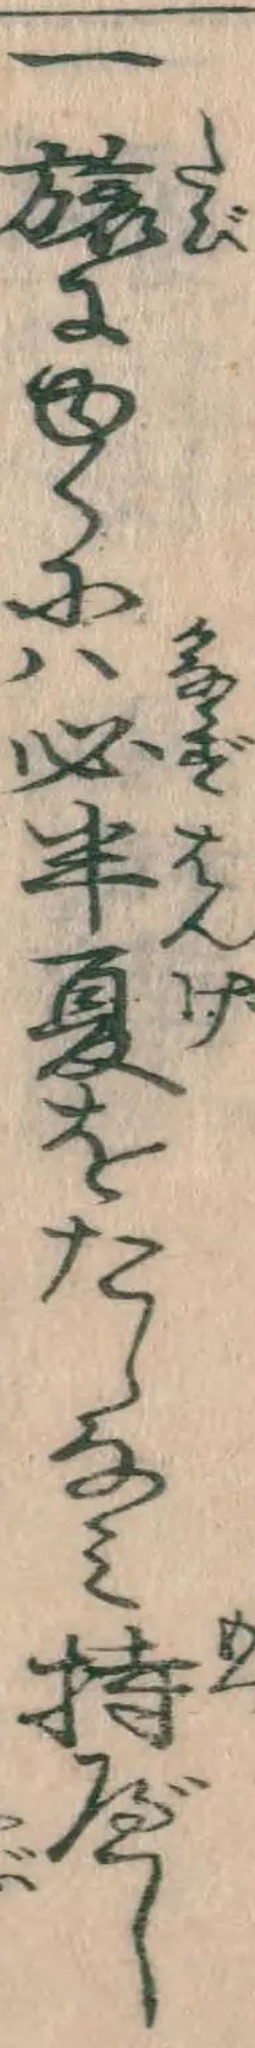一旅にゆくには必半夏をたしなみ持べし
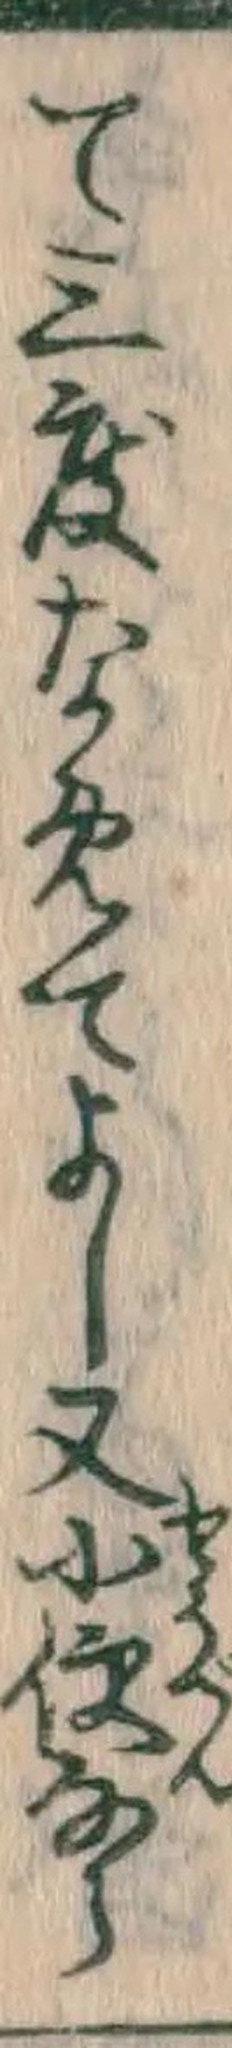て三度なめてよし又小便なら
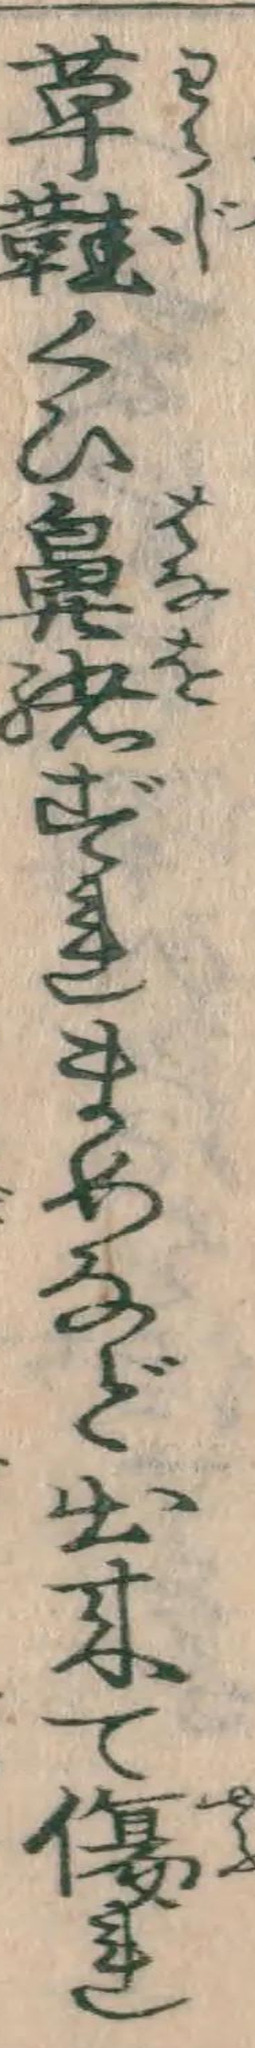草鞋くひ鼻緒ずれまめなど出来て傷れ
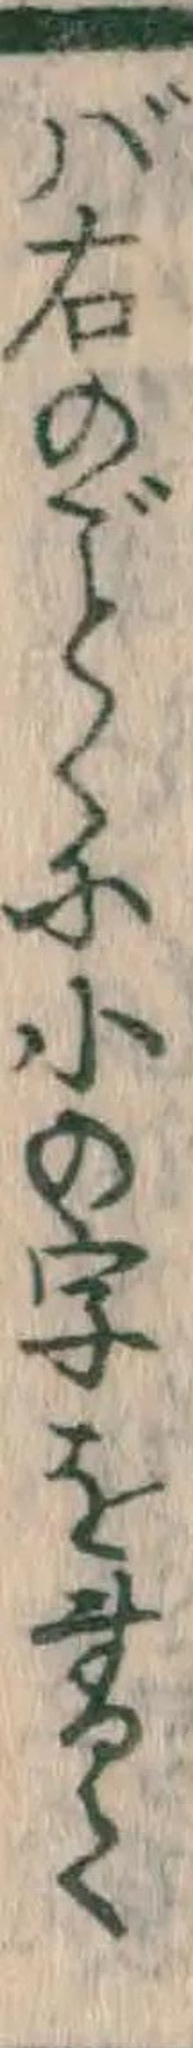ば右のごとくに小の字を書て
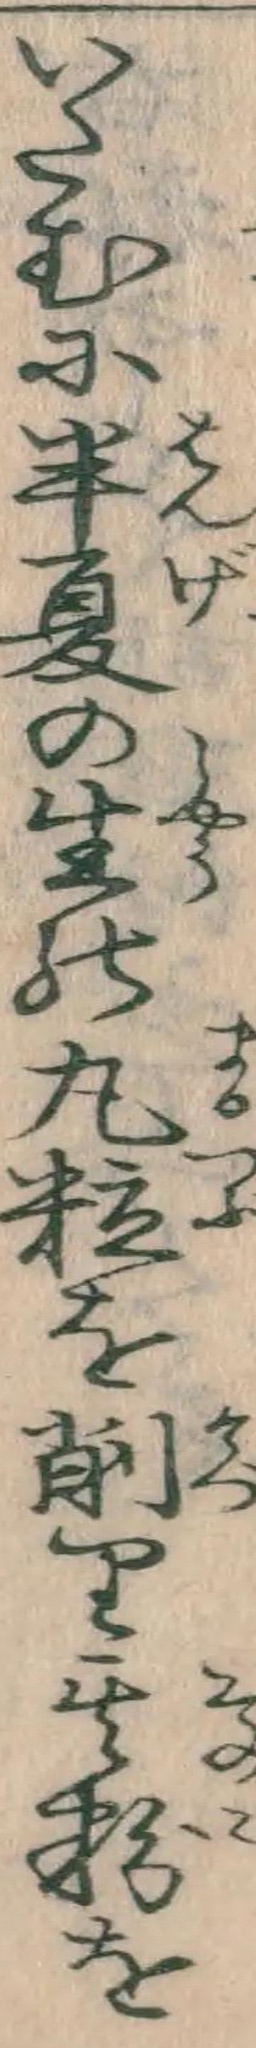いたむに半夏の生の丸粒を削り其粉を
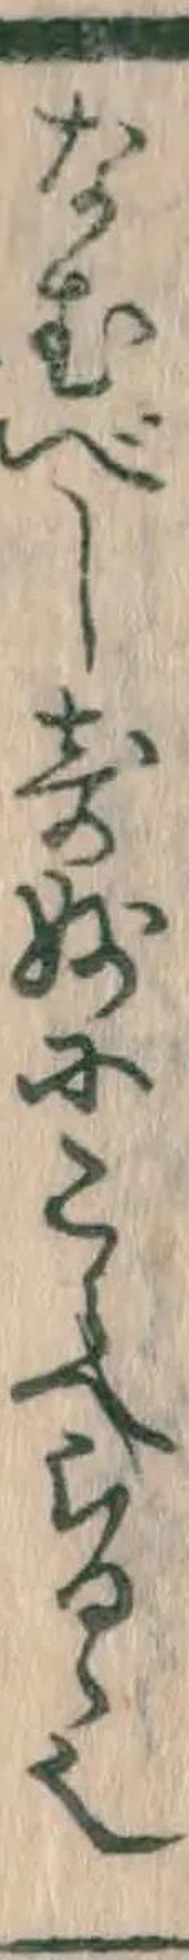なむべし奇妙にこらへらるゝ也
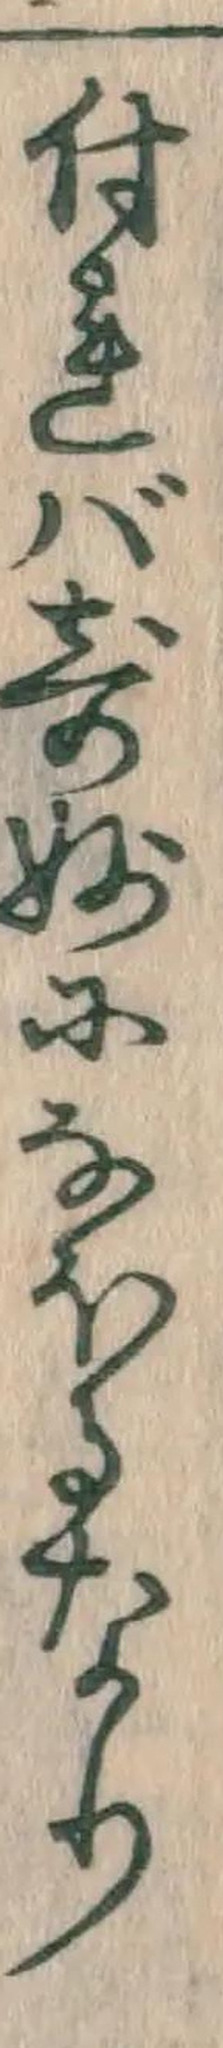付れば奇妙になほるなり
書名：広益秘事大全 3巻. [4]
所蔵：国立国会図書館 National Diet Library, JAPAN
